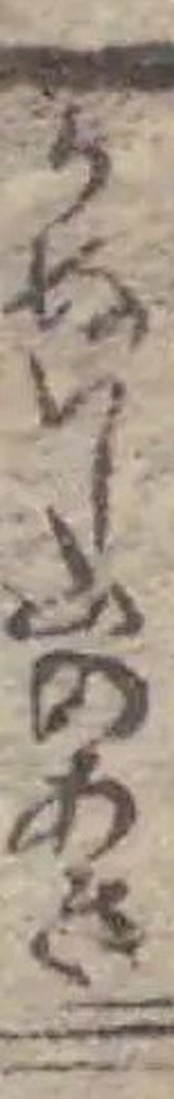かぬいし山のあき
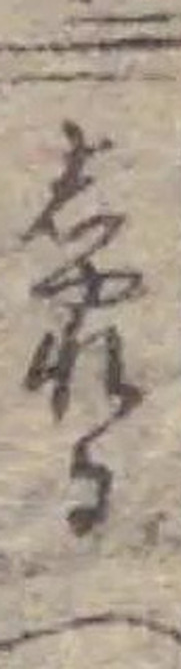しやれる
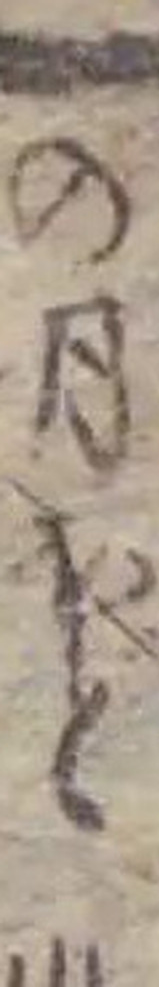の月ほど
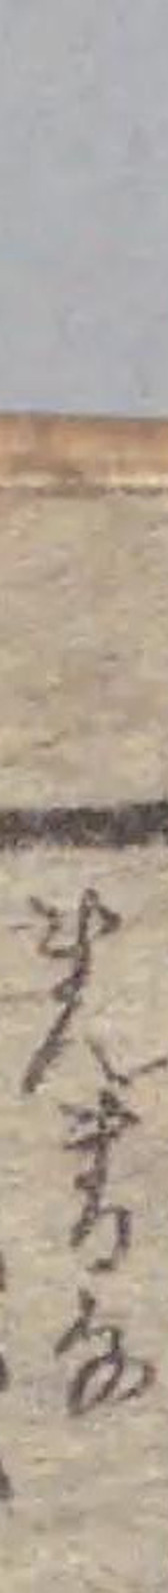まんまるな
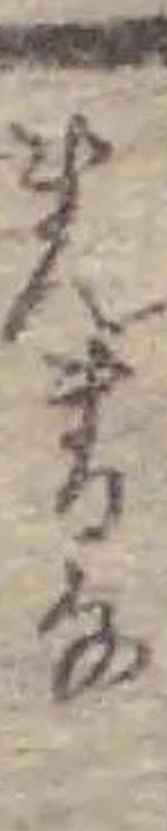まんまるな
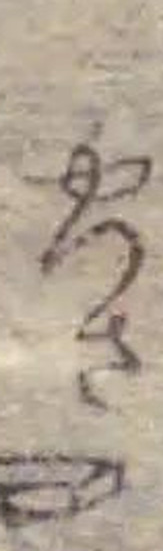やつさ
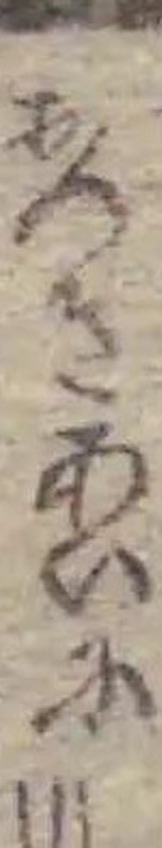おつきあいに
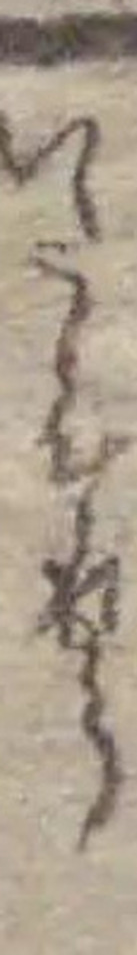いたしませう
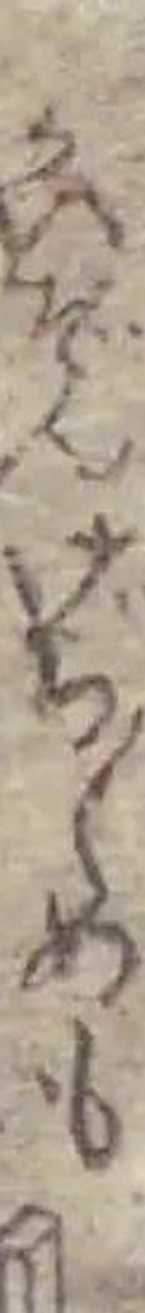かいぞんけぢ〳〵めも
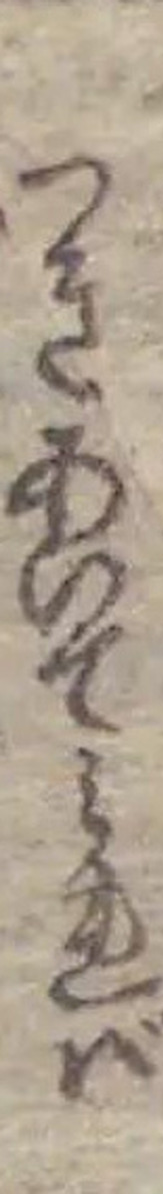つきあいてみれば
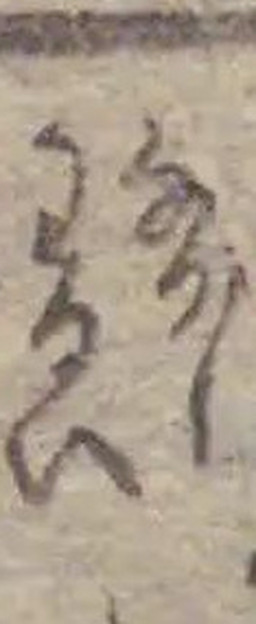わるい

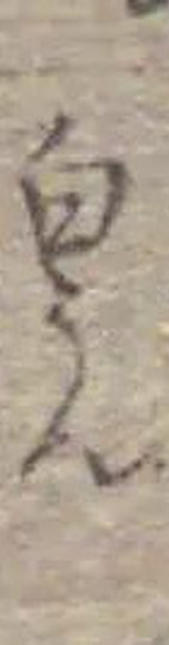白うん
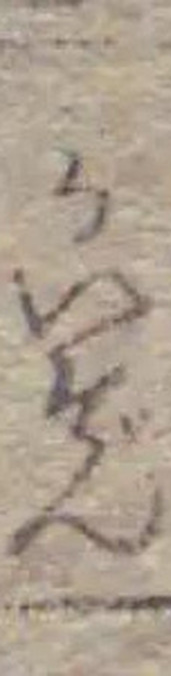かいぞん
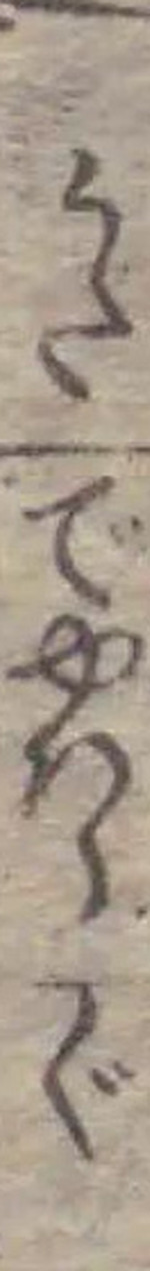うたでやはらぐ
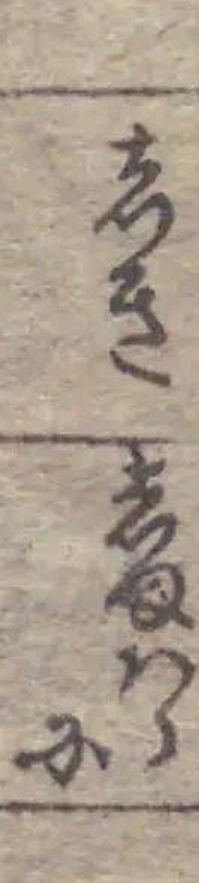しきしまばらに
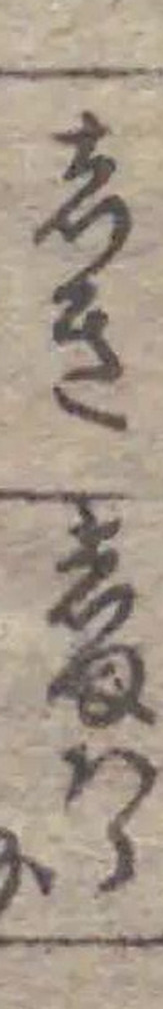しきしまばらに
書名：通増安宅関 2巻
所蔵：国立国会図書館 National Diet Library, JAPAN
